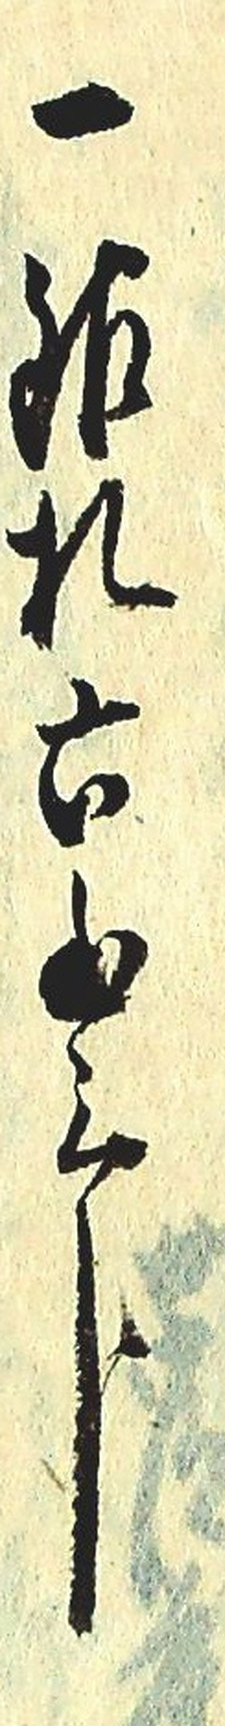一銀札六匁三分
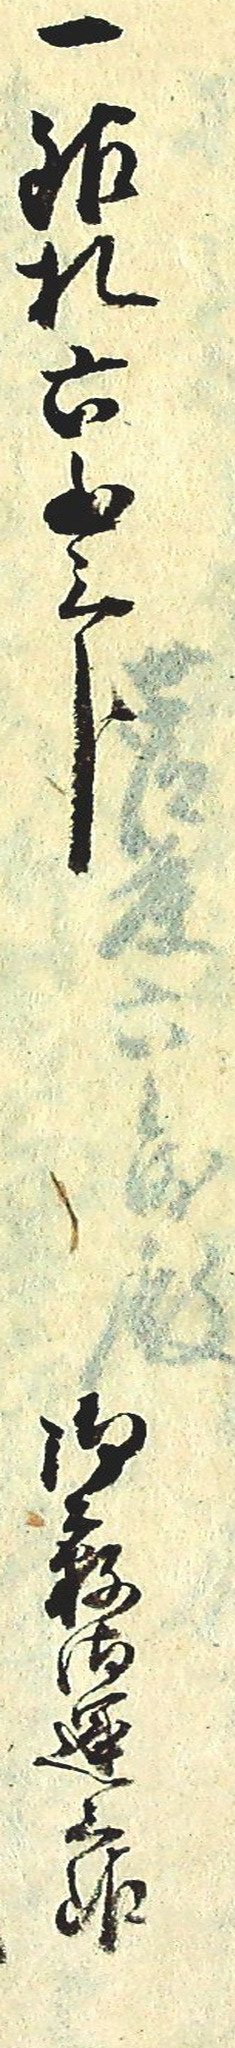一銀札六匁三分御藪御運上銀
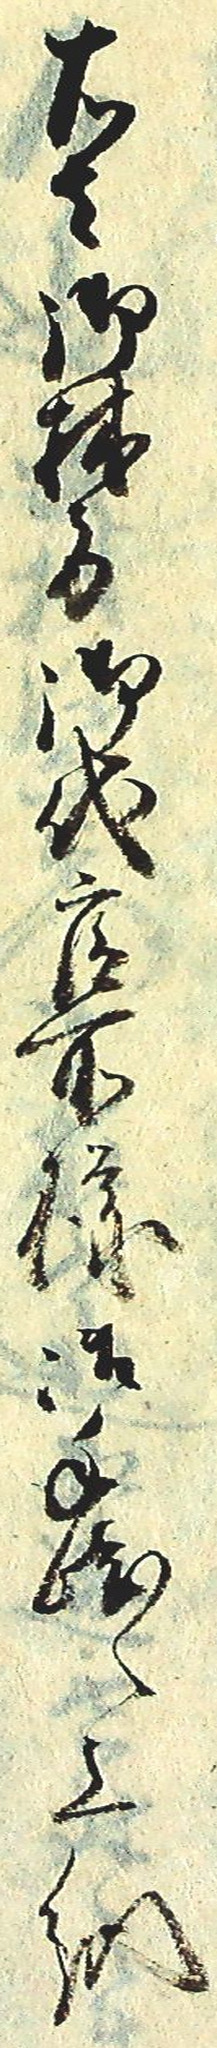右は御林方御代官所様御手崎へ上納
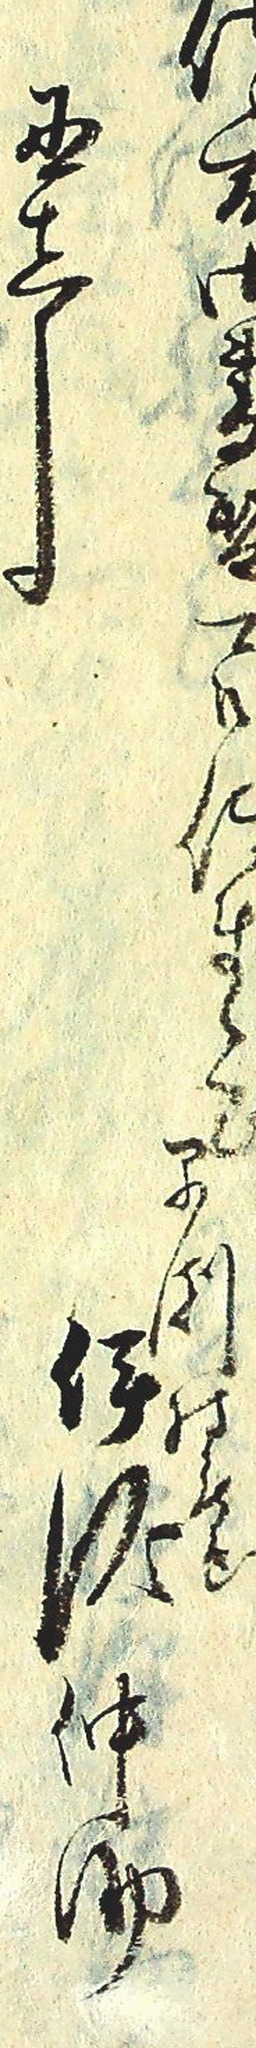丑十二月伊沢仲助
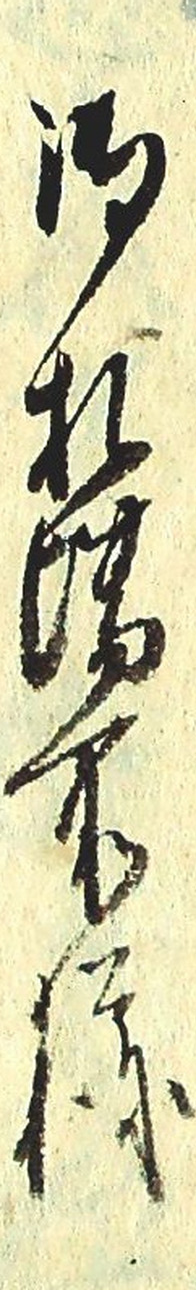御札場所様
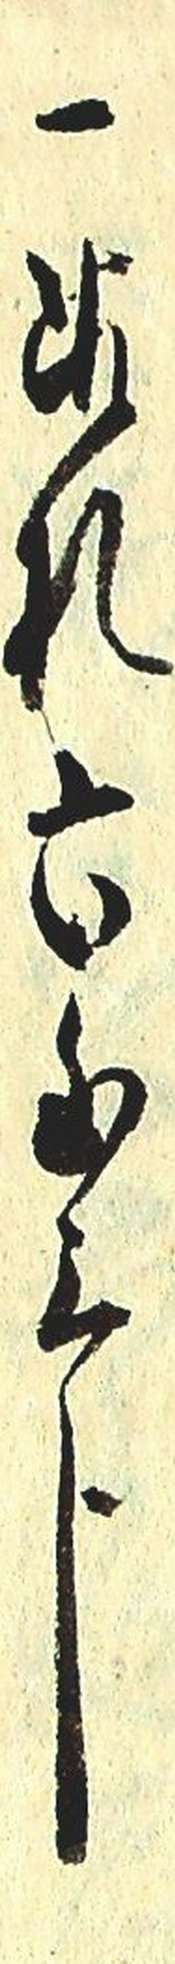一銀札六匁三分
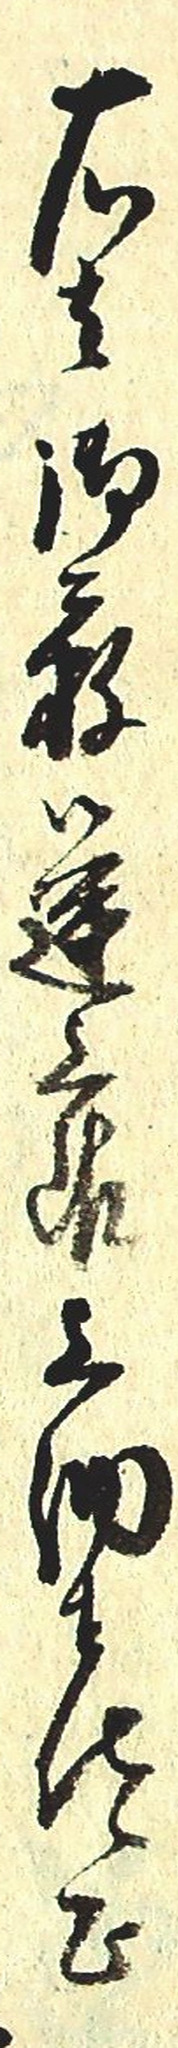右は御藪御運上銀上納奉仕候以上
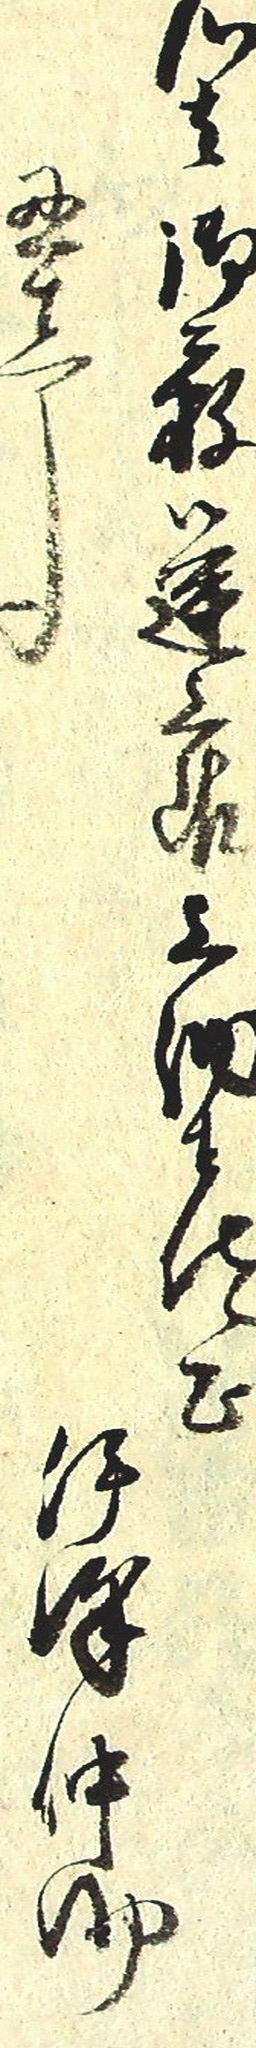丑十二月伊沢仲助
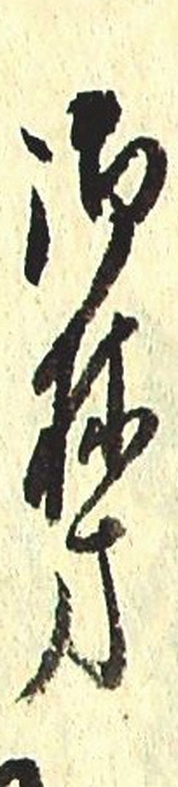御林方
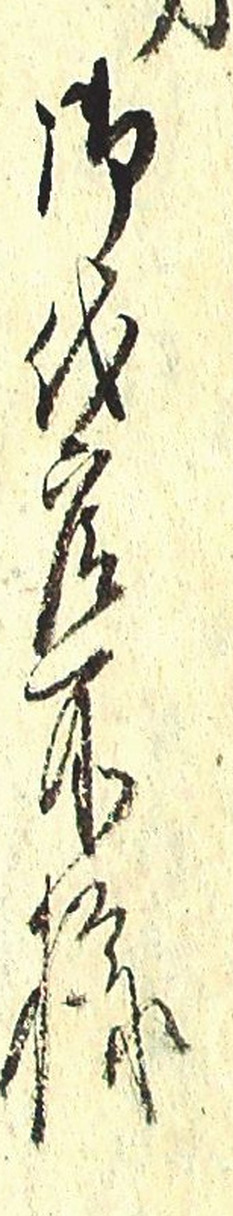御代官所様

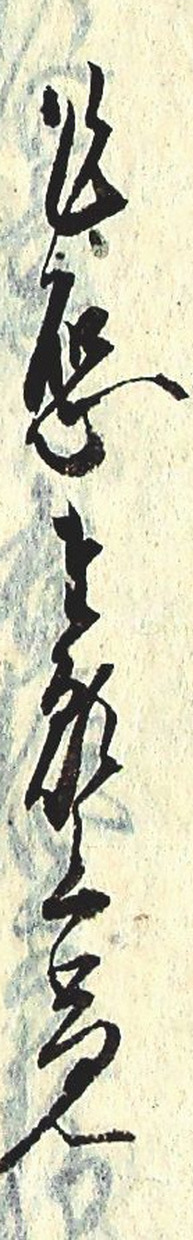乍恐奉願上覚
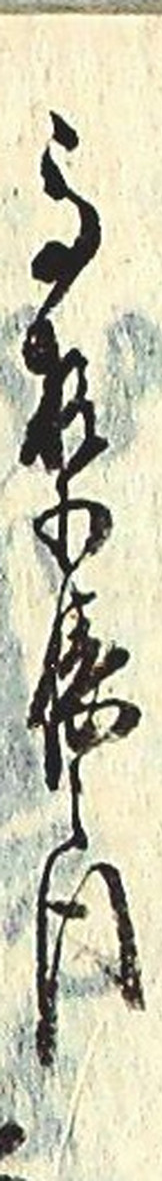高拾五俵之内
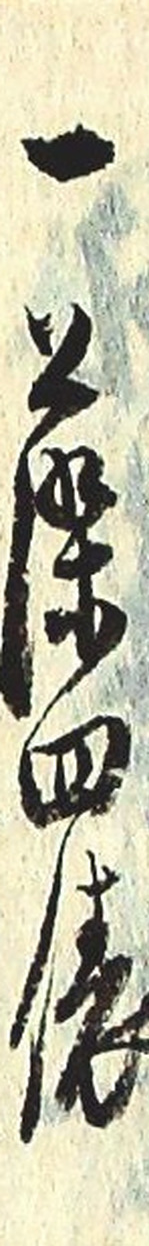一蒅四俵
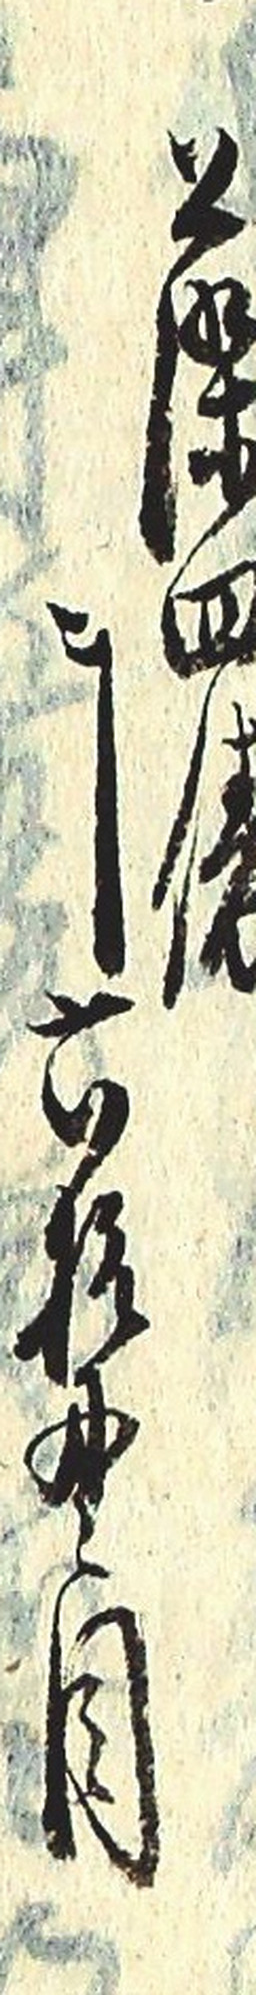正六拾貫目
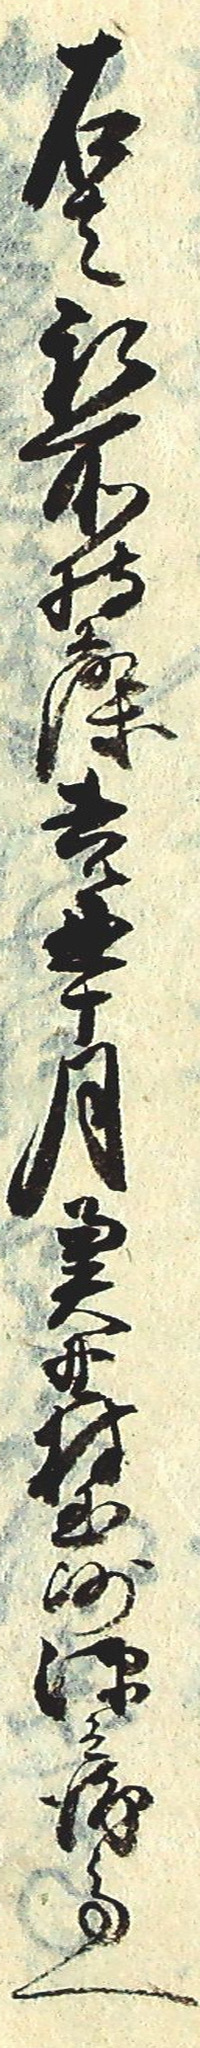右は私所持蒅去る丑十月奥野村玉師源兵衛方へ
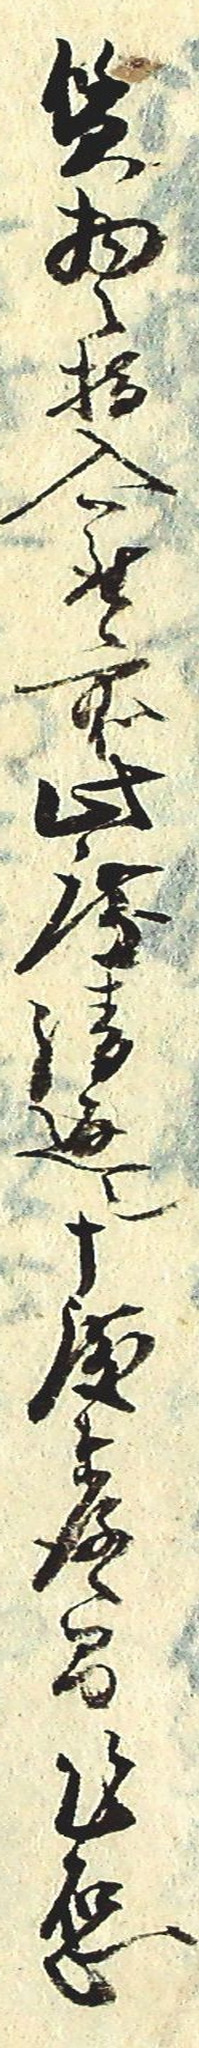質物に指入御座候所此度請返し申度奉存候間乍恐
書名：諸御願書控(弐番）
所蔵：鳴門教育大学 Naruto University of Education
